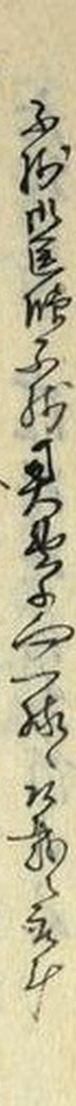不残御医師不残奥台子向一統へ頂戴ニ取計
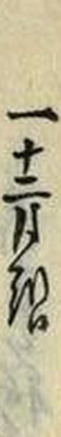一十二月朔日
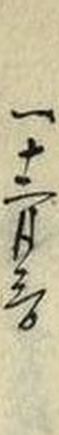一十二月朔日
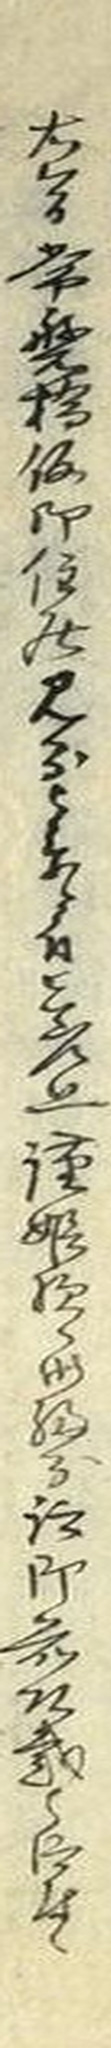右今日常盤橋仮御住居見分被参候ニ付被差上謹姫様へ御福分跡御前頂戴被仰付候
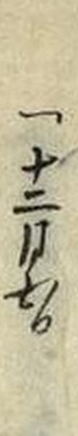一十二月朔日
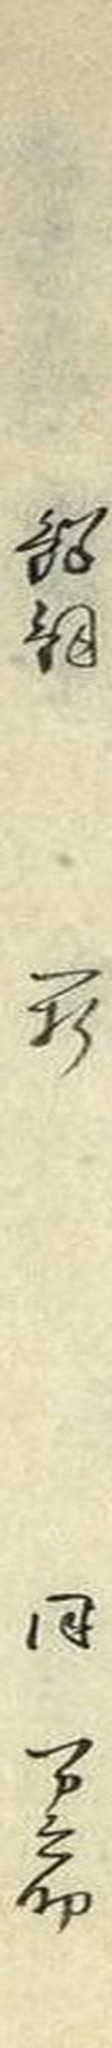鮮鯛一折同万之助
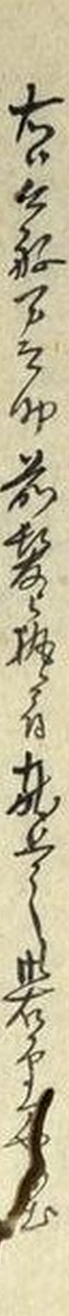右ハ今般万之助前髪被執候ニ付献上之御右筆部屋ゟ出
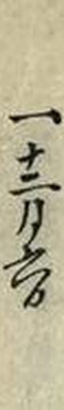一十二月朔日
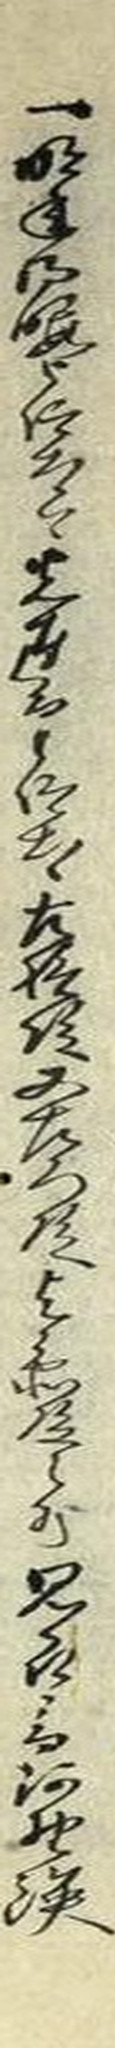一明年御暇被仰出候ハヽ先達而被仰出候左膳殿又左衛門殿与兵衛殿之外思召ニ而河野鍈
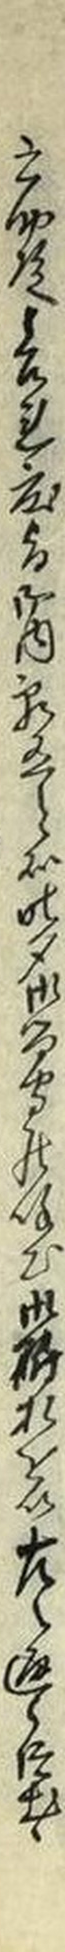之助殿被召連度旨御内願有之候処昨夕御留守居呼出御附札を以左之通被仰出候
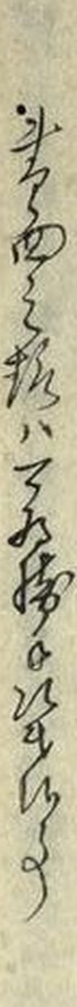書面之趣ハ可為勝手次第候事
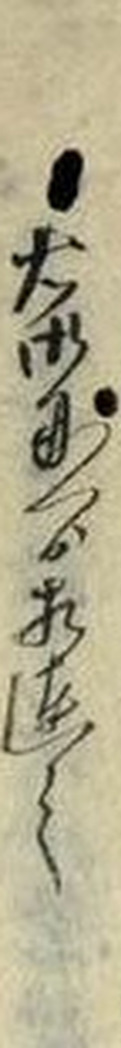右御用人ゟ相達之

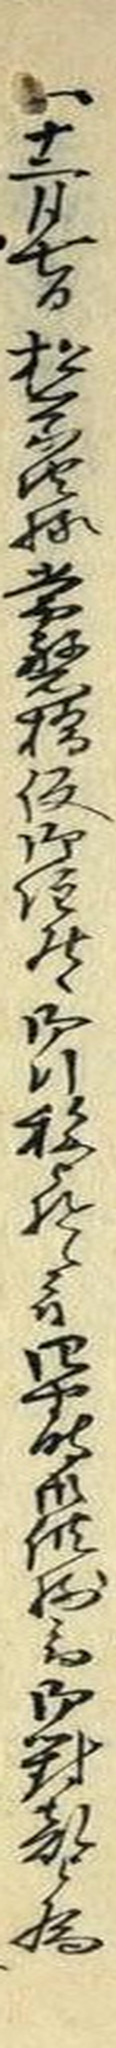一十二月七日松栄院様常盤橋仮御住居へ御引移被遊候ニ付四半時御供揃ニ而御対顔被為
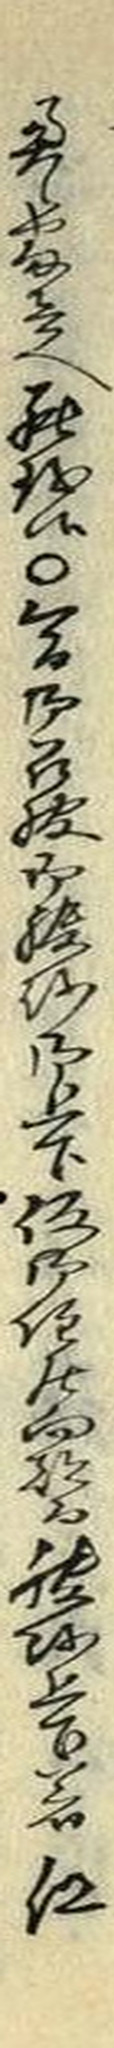奥之番壱人罷越候〇今日御召服御服紗御上下仮御住居向都而服紗上下着但
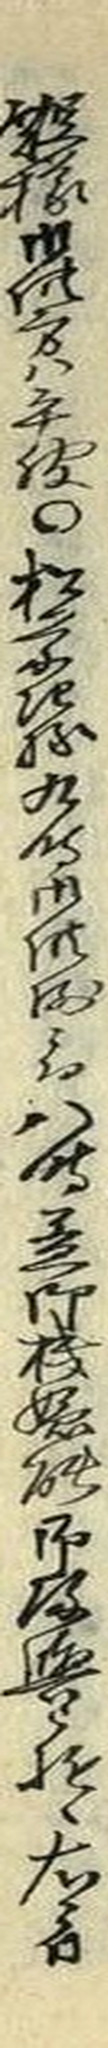殿様御供方ハ平服〇松栄院様九時御供揃ニ而八時益御機嫌能御帰輿被遊候右ニ付
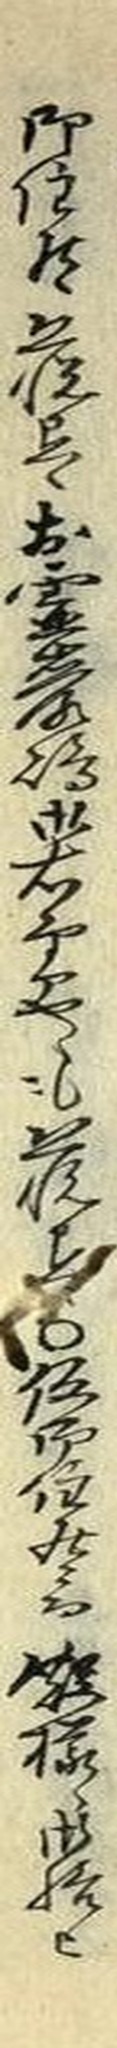御住居へ恐悦申上候於霊厳嶋御右筆部屋へも恐悦申上候〇仮御住居ニ而殿様へ御膳被
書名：少傅日録抄（斉善付側向頭取日記、在府）
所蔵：福井県文書館 Fukui Prefectural Archives
